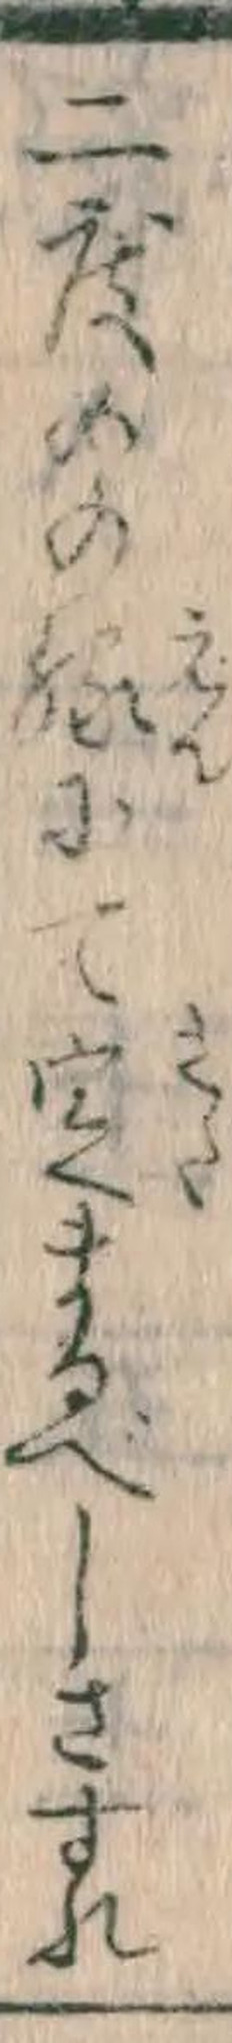二度めの縁にて定まるべしさすれ
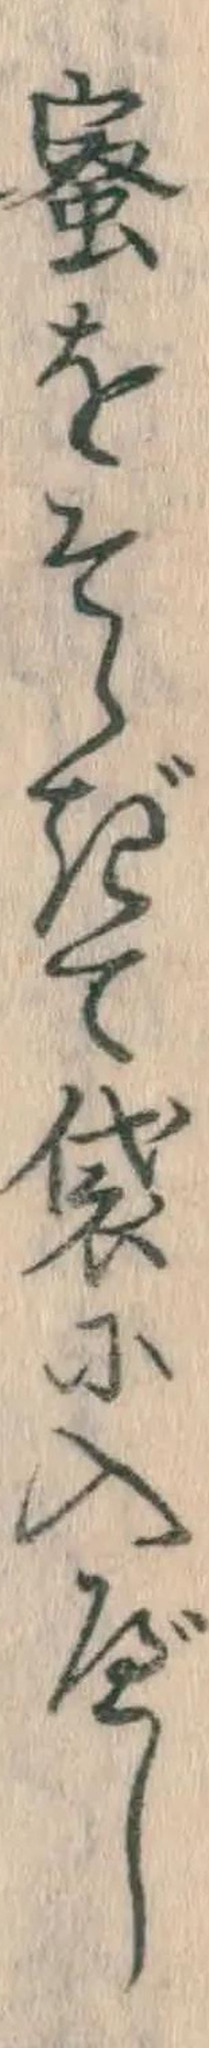蜜をそゝぎて袋に入べし
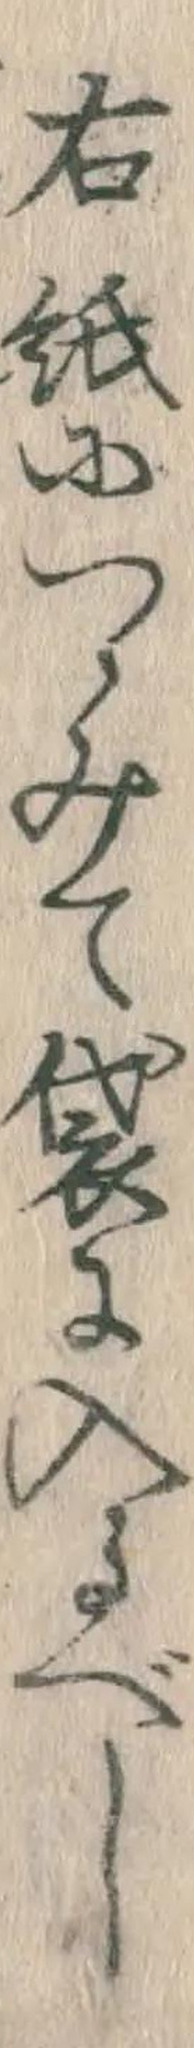右紙につゝみて袋に入るべし
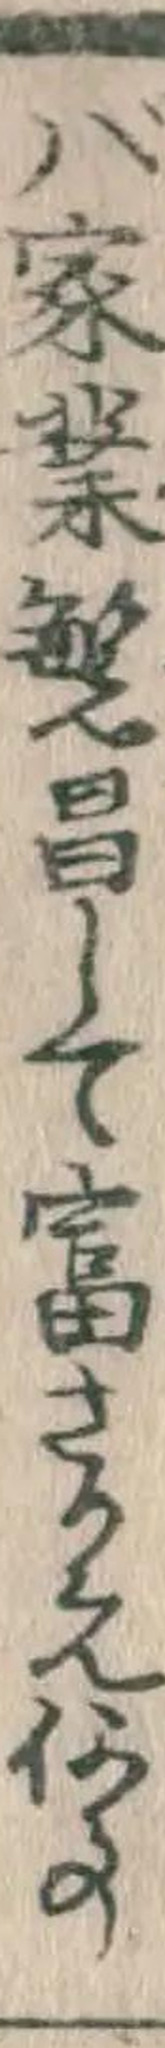ば家業繁昌して富さかえ何事
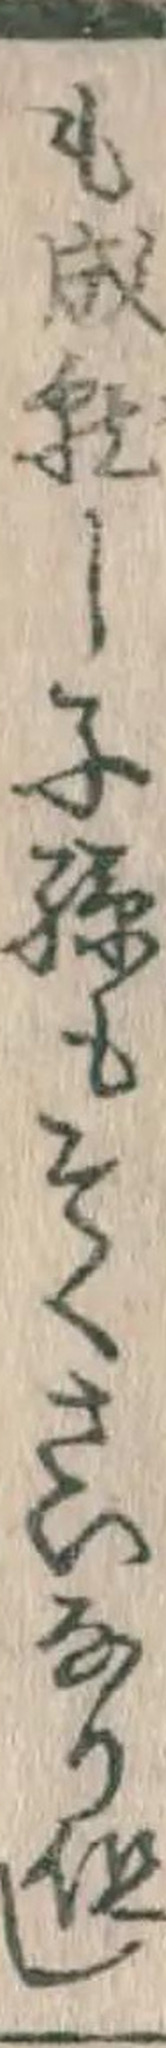も成就し子孫もそくさいなり但し
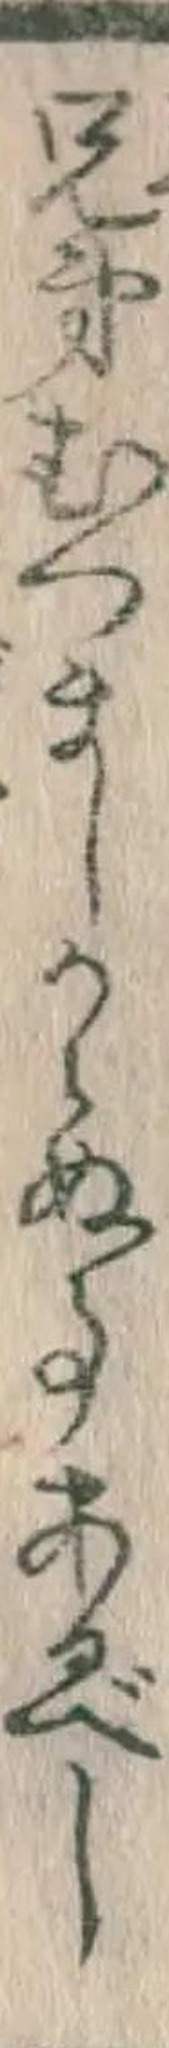兄弟むつましからぬ事あるべし
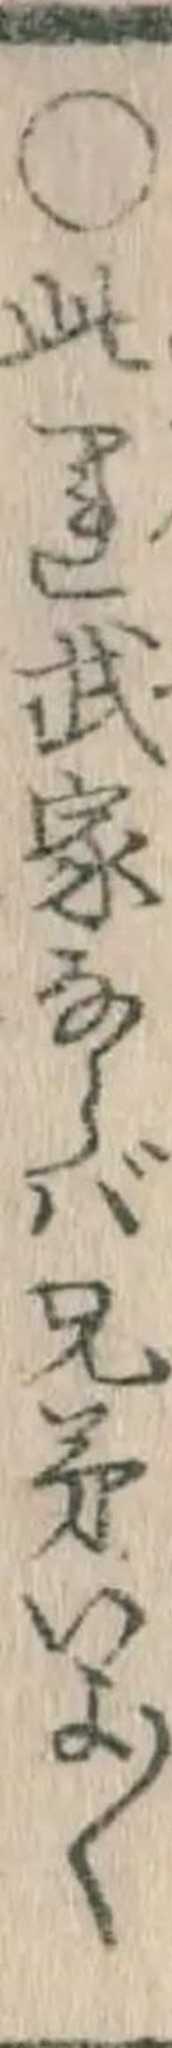○此運武家ならば兄弟いよ〳〵
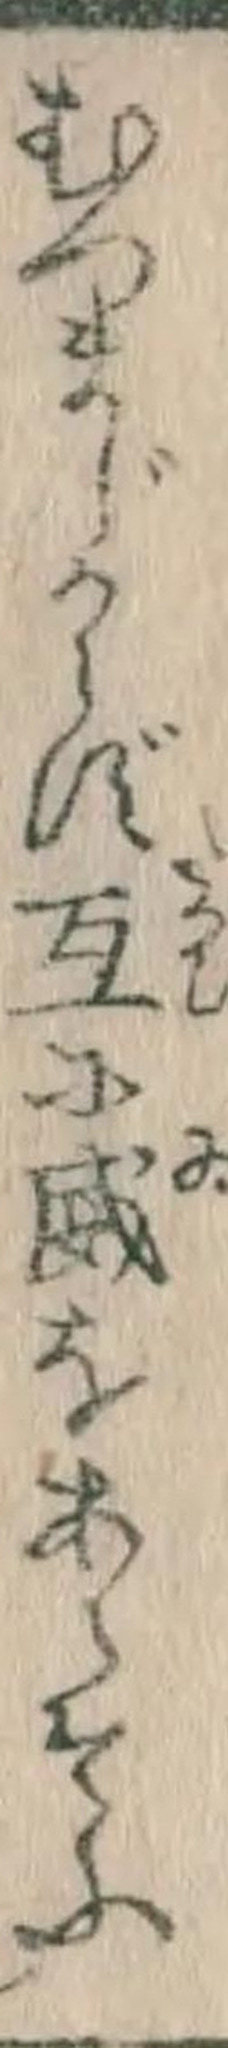むつまじからず互に威をあらそふ
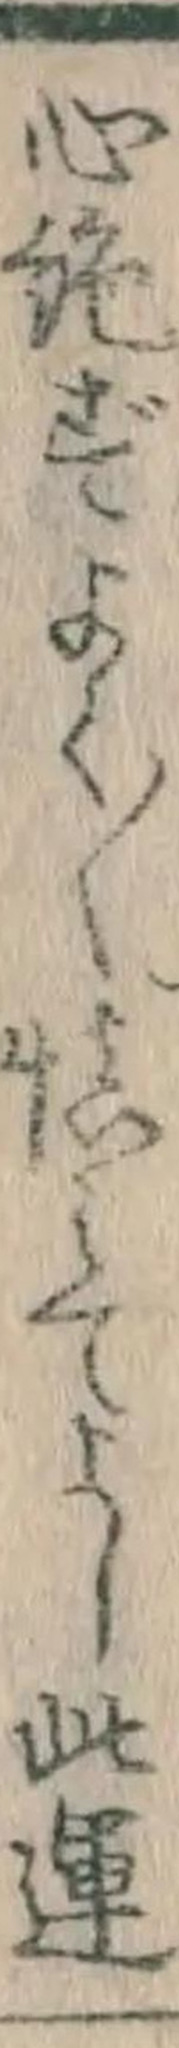心絶ずよく〳〵慎みてよし此運

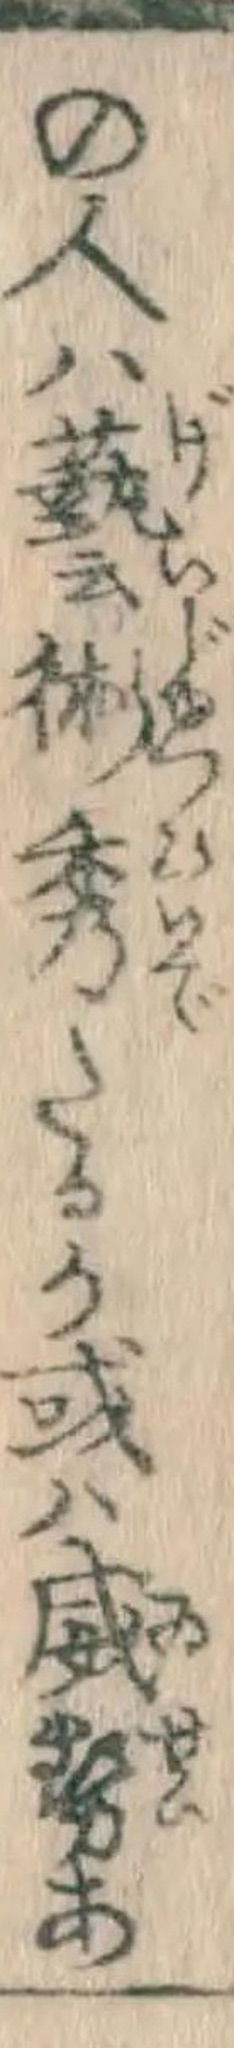の人は芸術秀たるか或は威勢あ
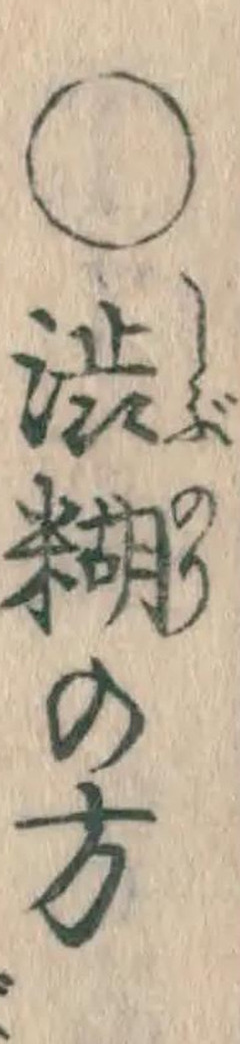○渋糊の方
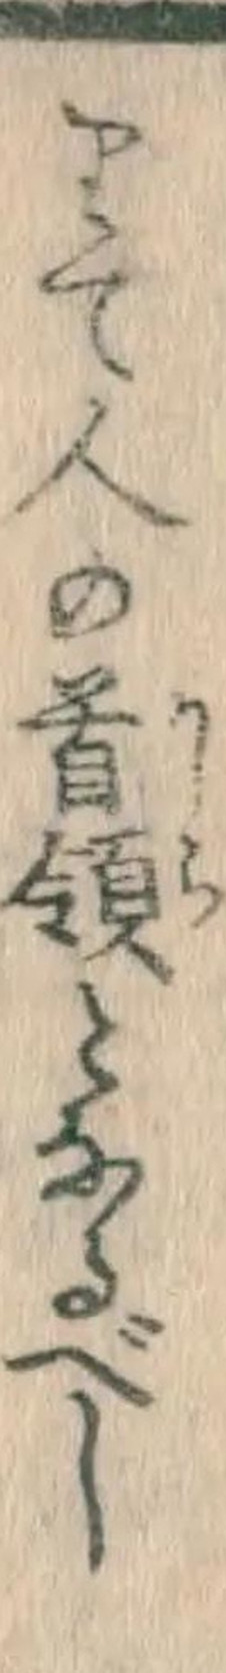りて人の首領となるべし
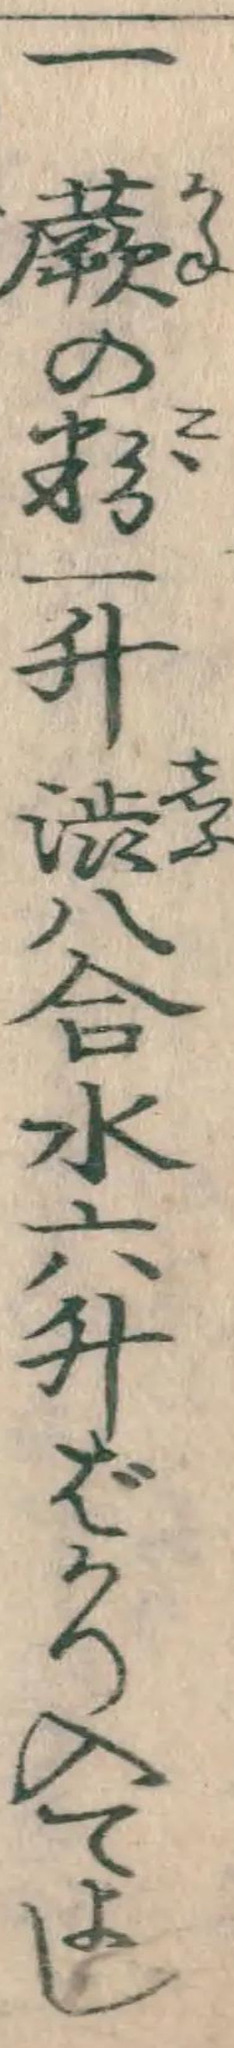一蕨の粉一升渋八合水六升ばかり入てよし
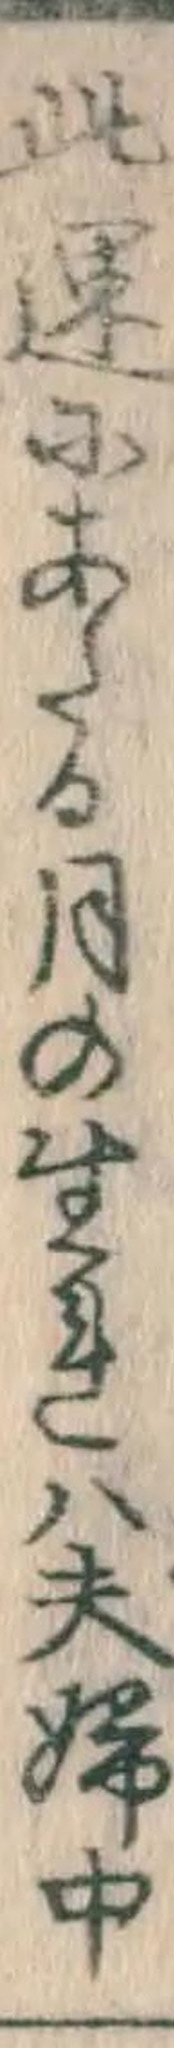此運にあたる月の生れは夫婦中
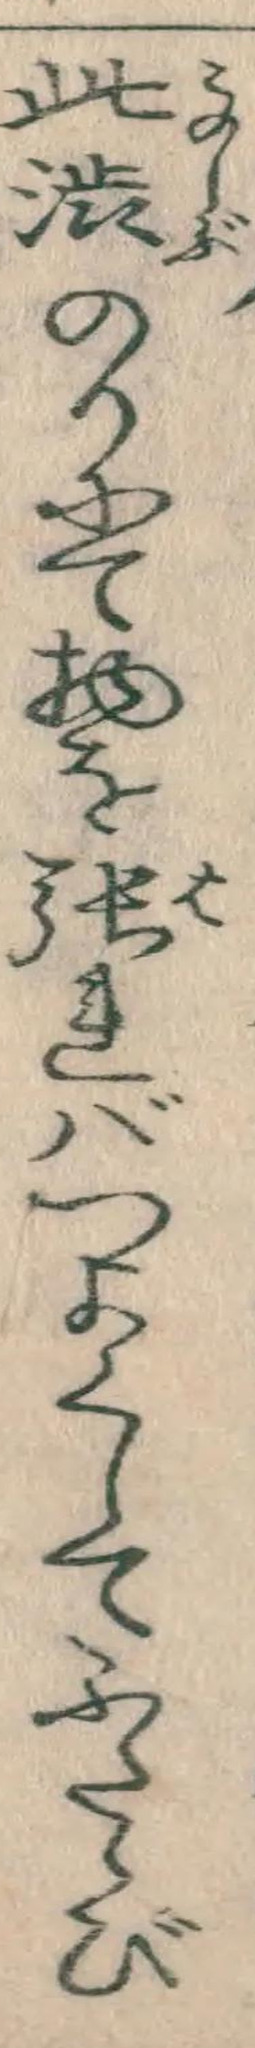此渋のりにて物を張ればつよくしてふたゝび
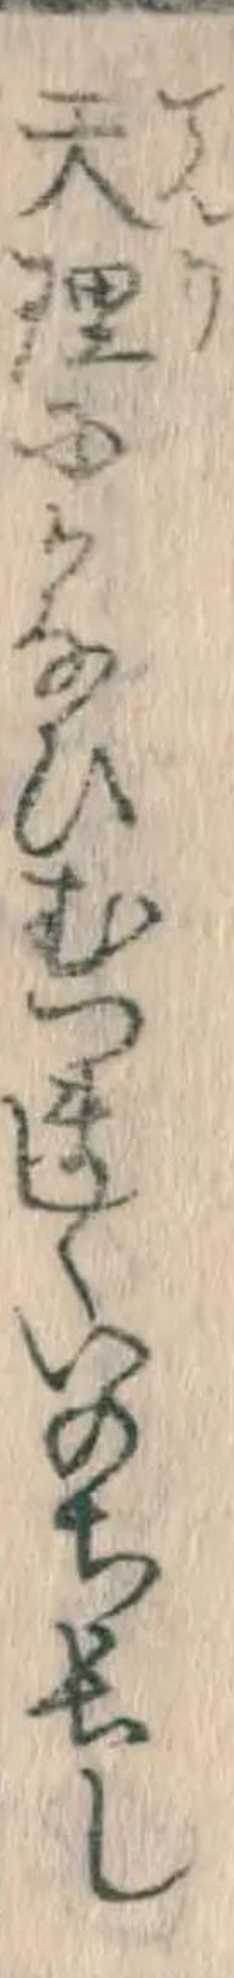天理にかなひむつましくいのち長し
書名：広益秘事大全 3巻. [2]
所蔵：国立国会図書館 National Diet Library, JAPAN
